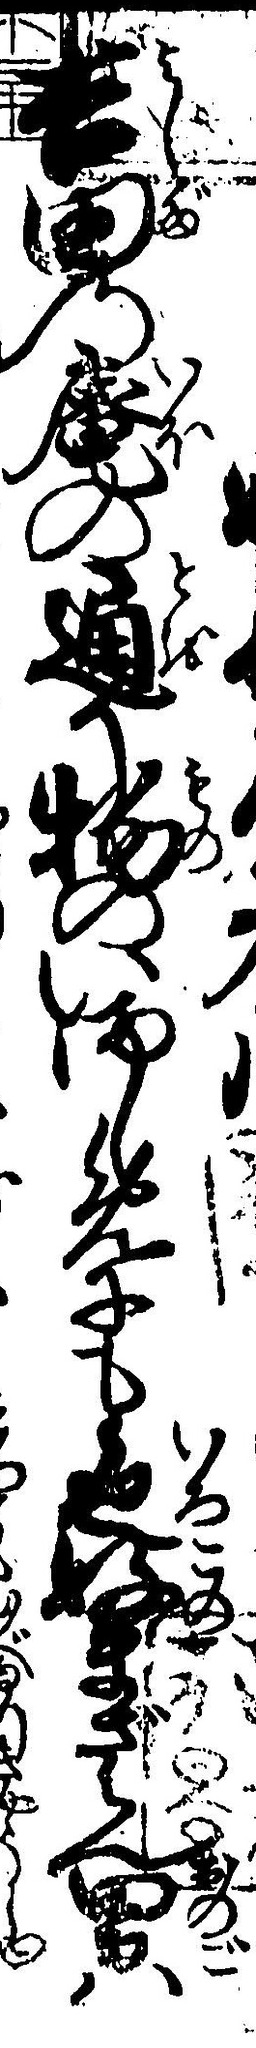吉田の庵の通り物のいましめにも色好まざらん男は
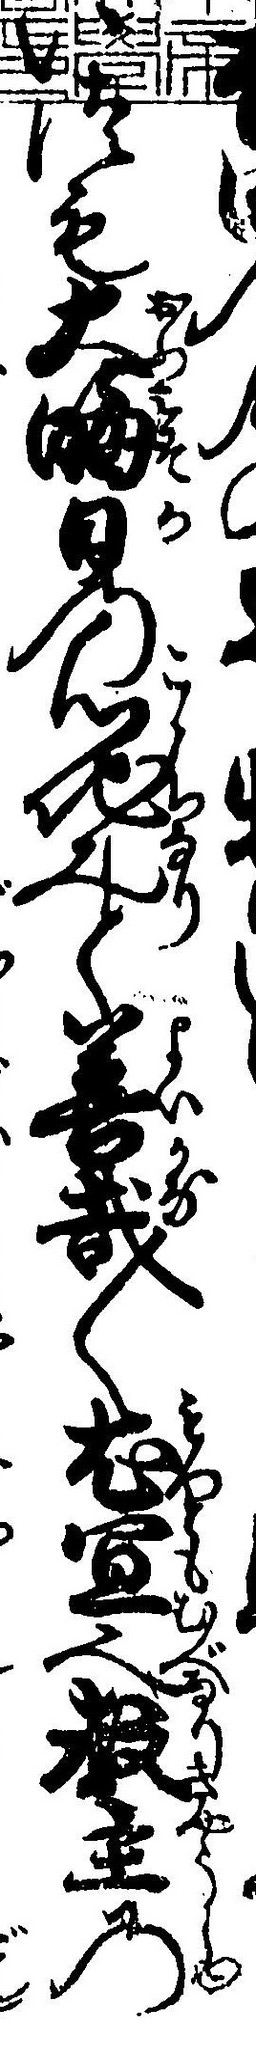いつも大晦日の心地也と善哉〳〵尤宜也教主の
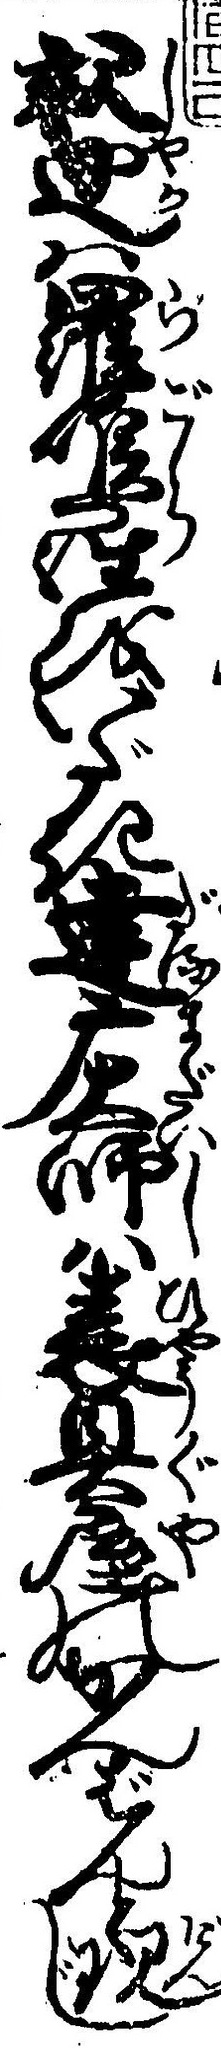釈迦は羅睺羅をいだき達磨大師は表具屋のかんばんと現じ
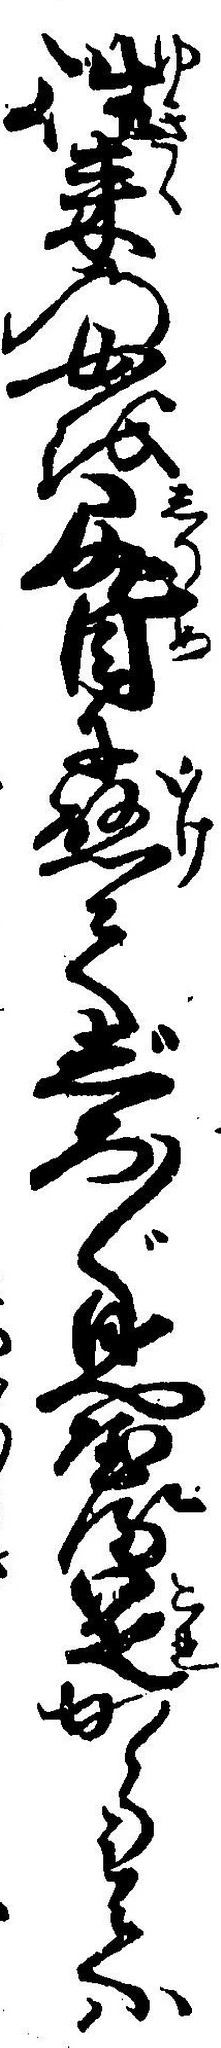往来の女を尻目に懸てじろ〳〵見やる是からみるに
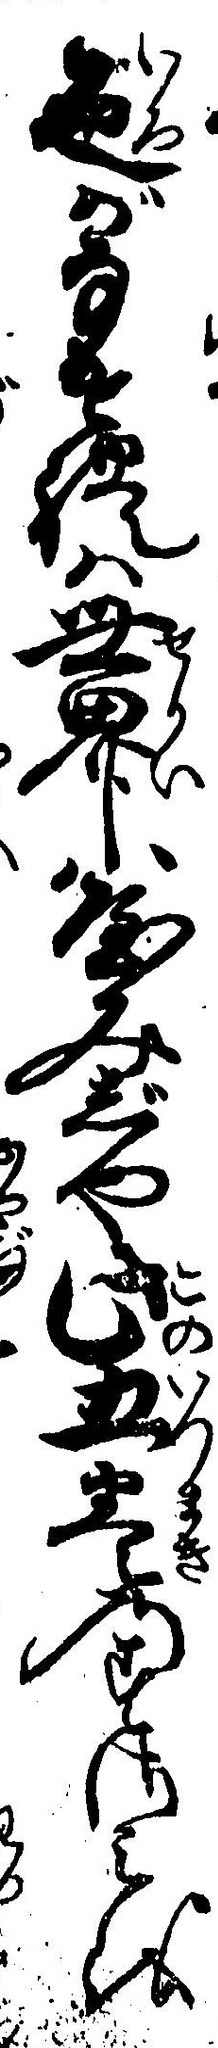色がなけれは世界はやみじや此五巻のすさみを
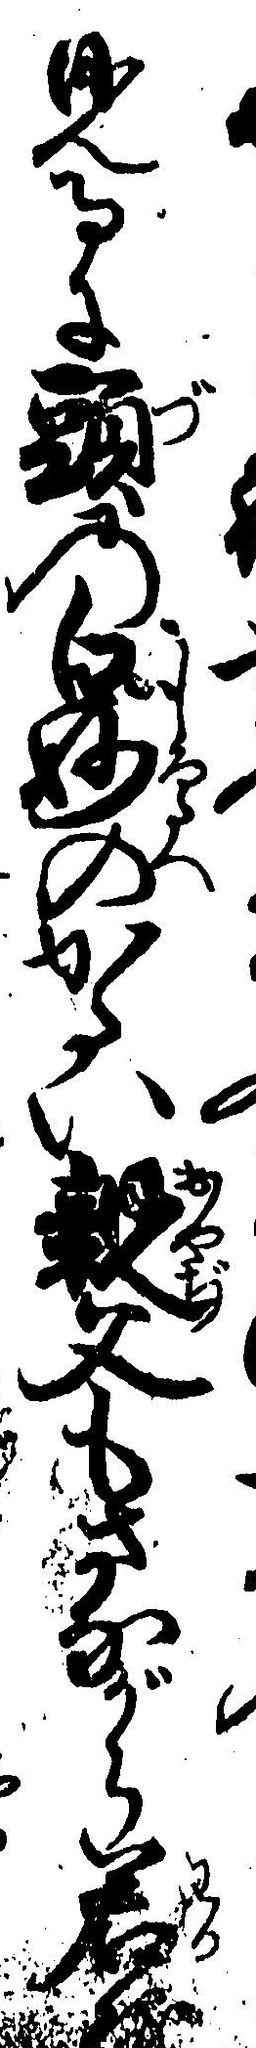見るに頭の白妙のかたい親父もさながら若
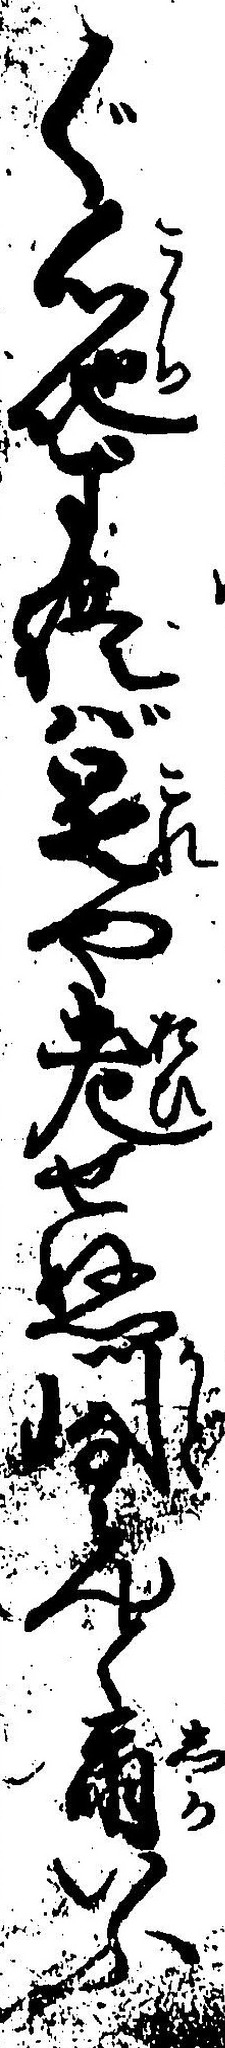〴〵心地すれば是や老せぬ門ならんと爾いふ
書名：好色不老門
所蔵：東京大学総合図書館 General Library in the University of Tokyo, JAPAN
